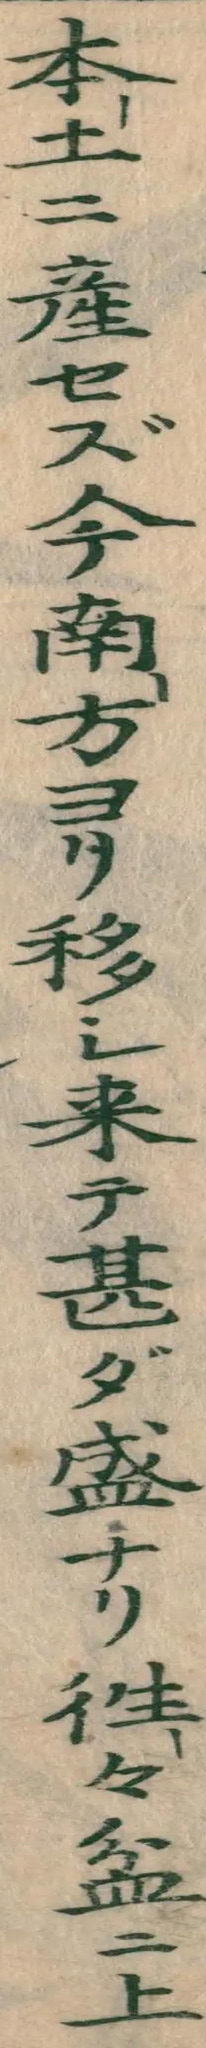本-土ニ産セズ今南-方ヨリ移シ来テ甚ダ盛ナリ往-々盆ニ上
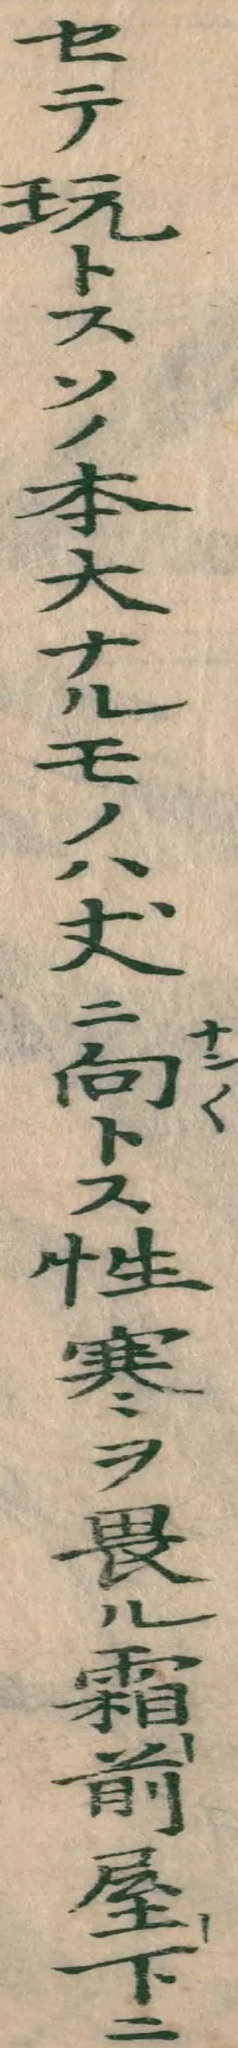セテ玩トスソノ本大ナルモノハ丈ニ向トス性寒ヲ畏ル霜-前屋-下ニ
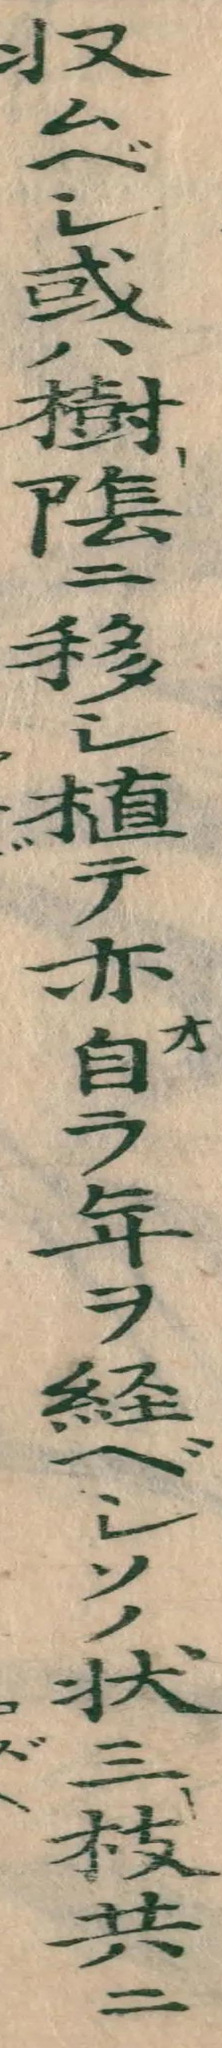収ムベシ或ハ樹-陰ニ移シ植テ亦自ラ年ヲ経ベシソノ状三-枝共ニ
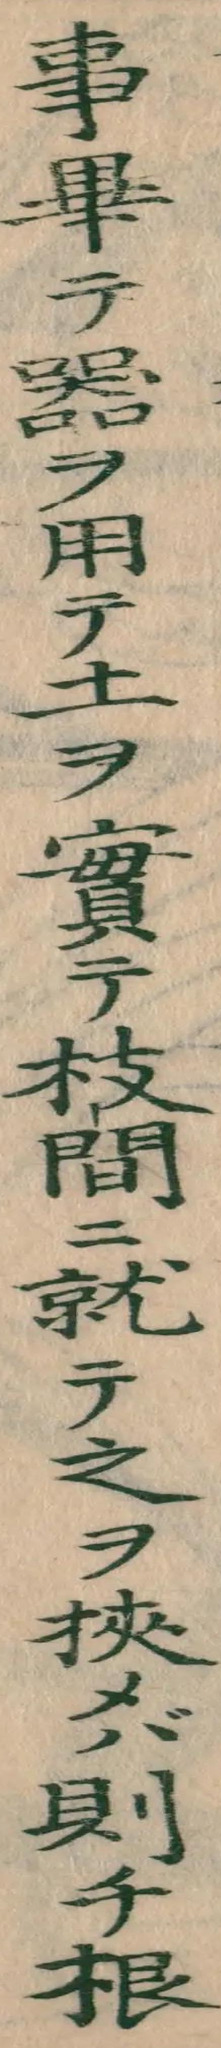事畢テ器ヲ用テ土ヲ実テ枝-間ニ就テ之ヲ挟メバ則チ根
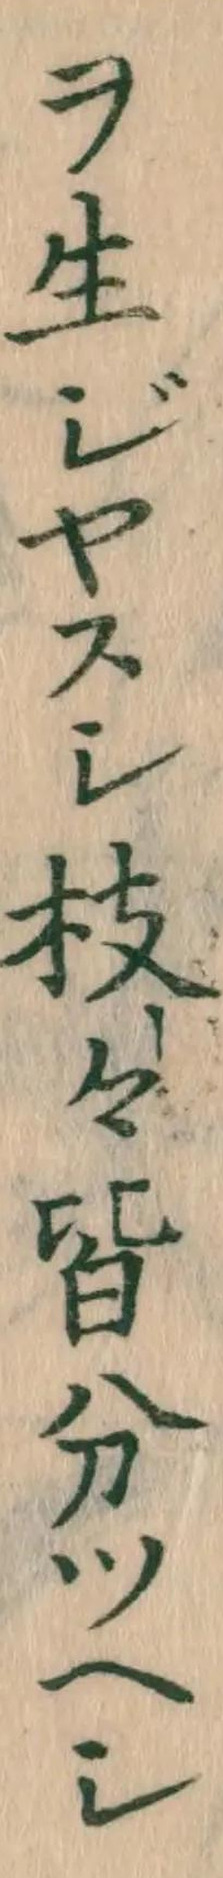ヲ生ジヤスシ枝-々皆分ツヘシ
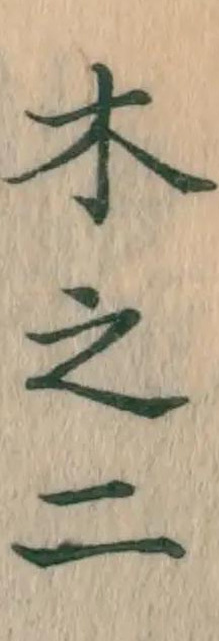木之二
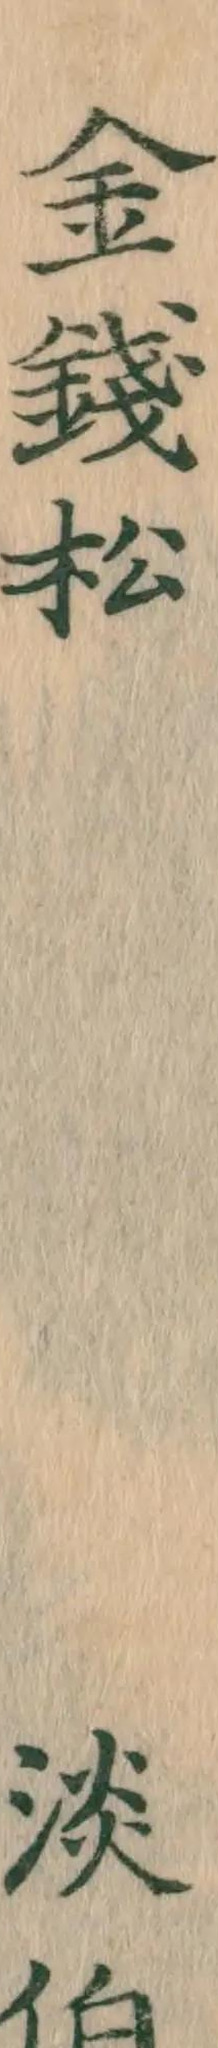金銭松淡伯

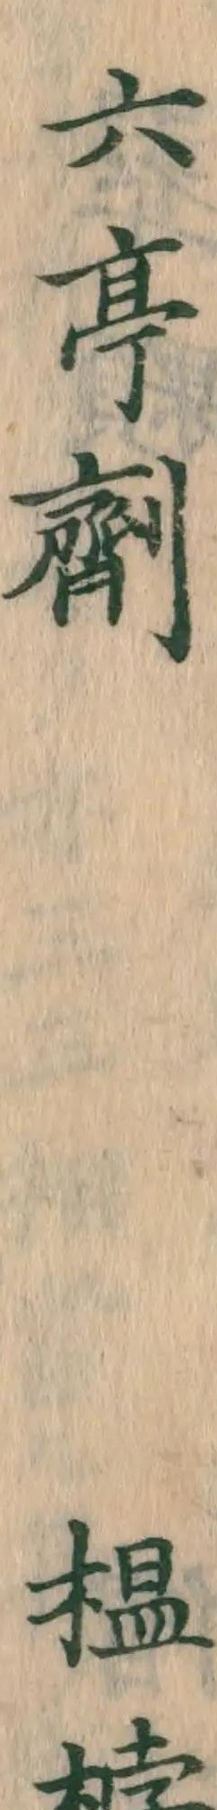六亭剤榲桲
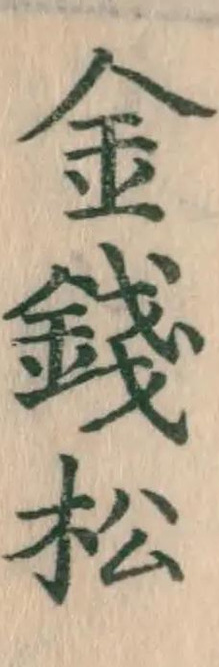金銭松

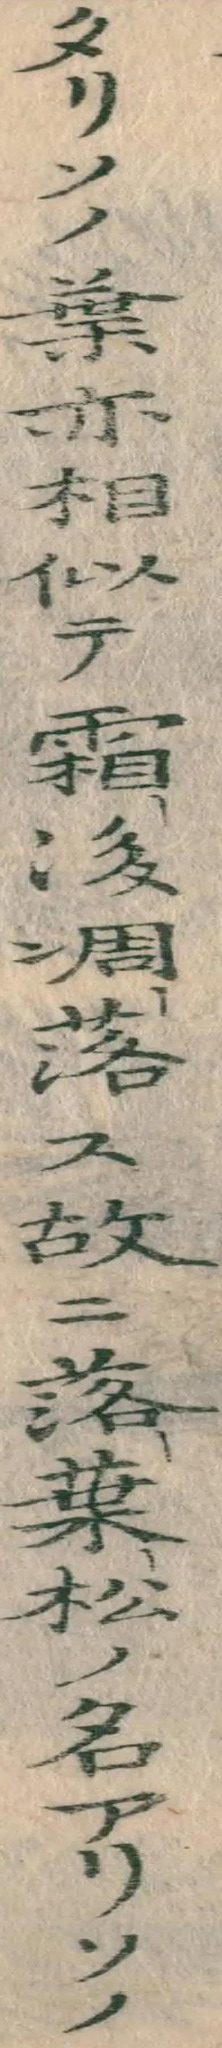タリソノ葉亦相似テ霜-後凋-落ス故ニ落-葉-松ノ名アリソノ
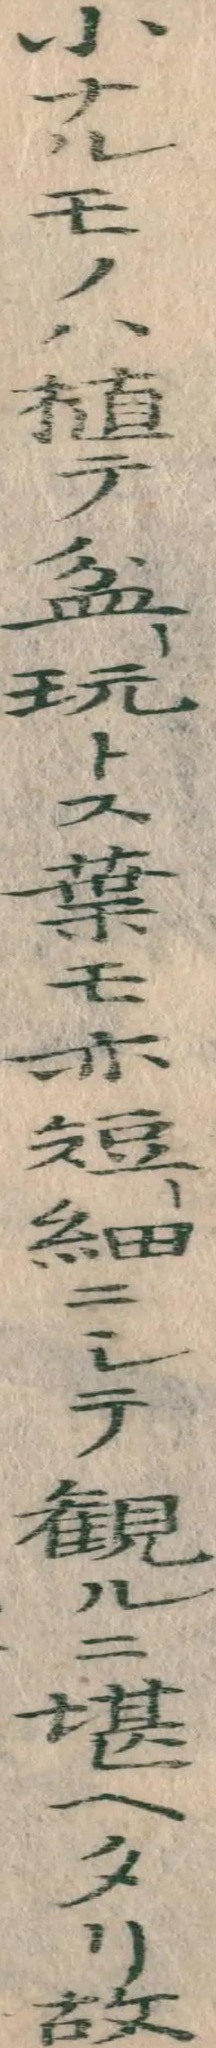小ナルモノハ植テ盆-玩トス葉モ亦短-細ニシテ観ルニ堪ヘタリ故
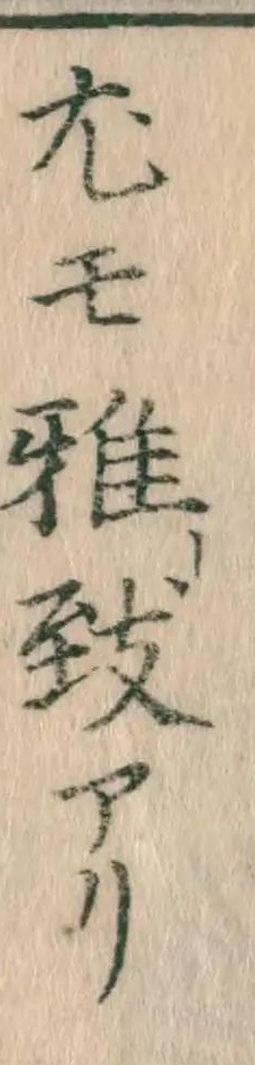尤モ雅-致アリ

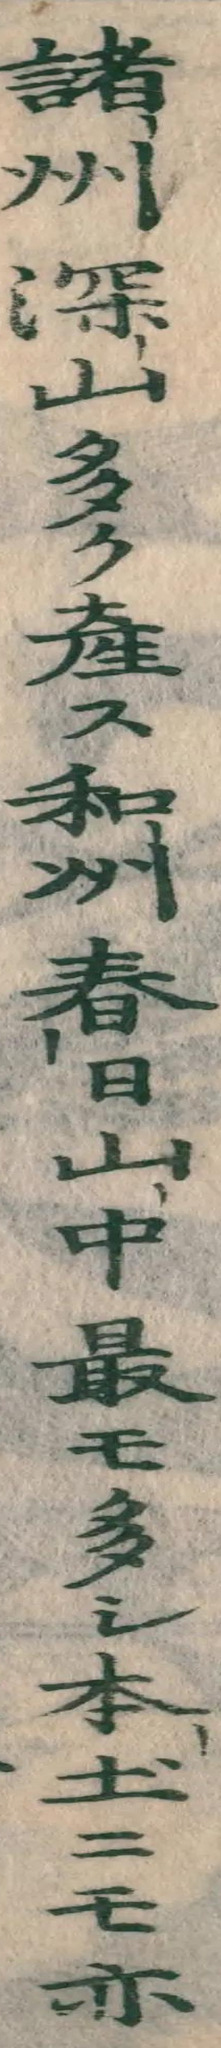諸-州深-山多ク産ス和-州春-日山-中最モ多シ本-土ニモ亦
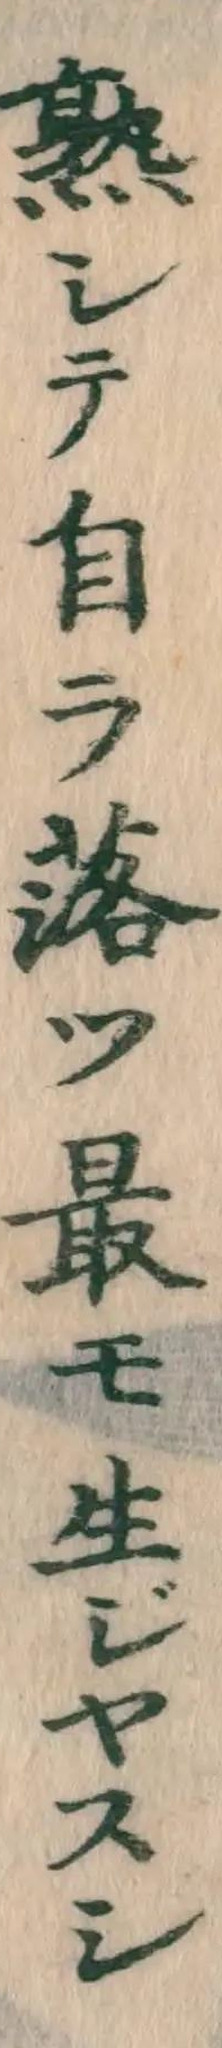熟シテ自ラ落ツ最モ生ジヤスシ
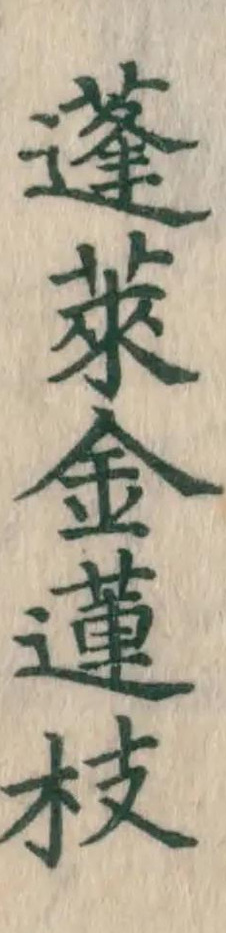蓬莱金蓮枝

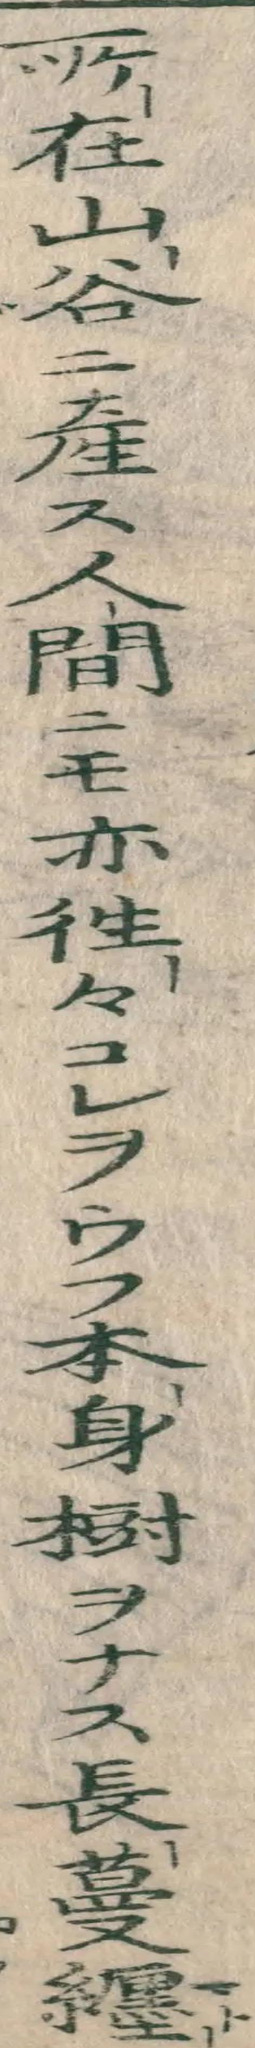所-在山-谷ニ産ス人-間ニモ亦往-々コレヲウフ本-身樹ヲナス長-蔓纏-
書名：花彙 草部4巻木部4巻. [2]
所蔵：国立国会図書館 National Diet Library, JAPAN
